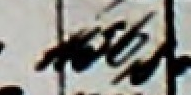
1156,?
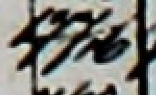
177,6
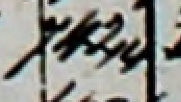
7112,4
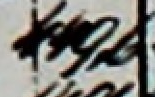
1149,6
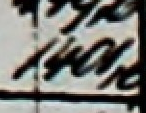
1401,6
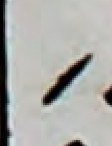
1
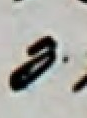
3
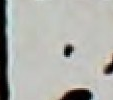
,
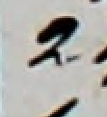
2
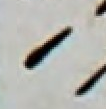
1
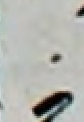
,
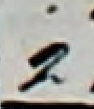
2
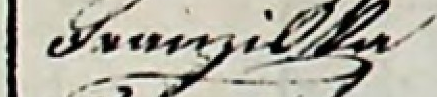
Franziska
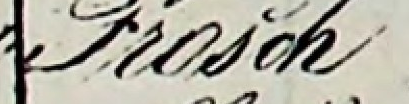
Frosch
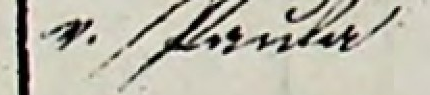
v. Paula
